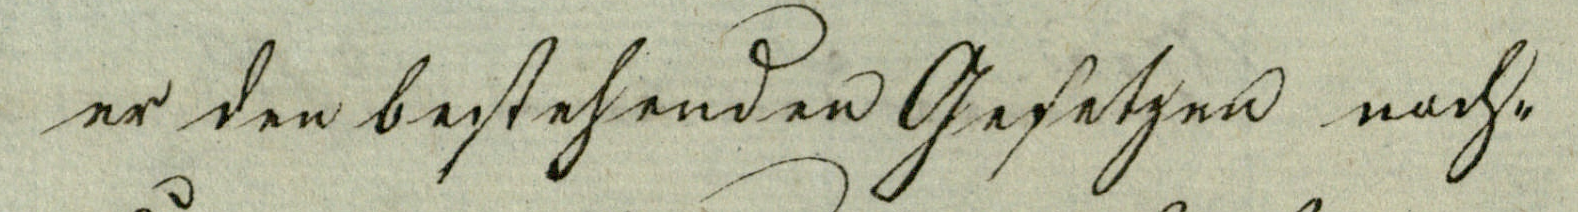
er den bestehenden Gesetzen nach¬
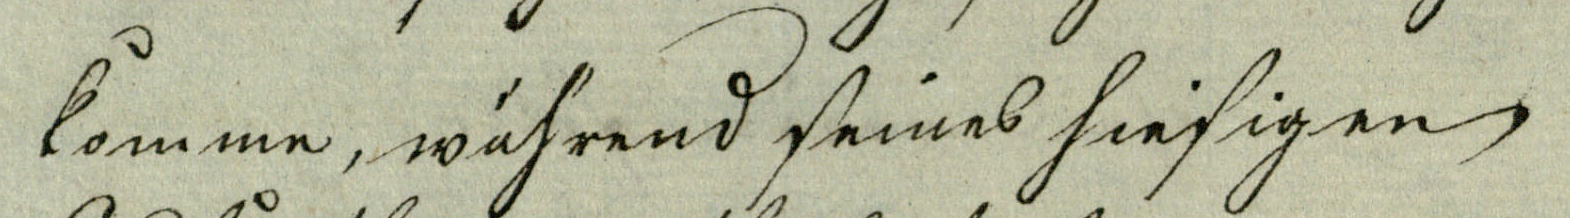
komme, während seines hiesigen
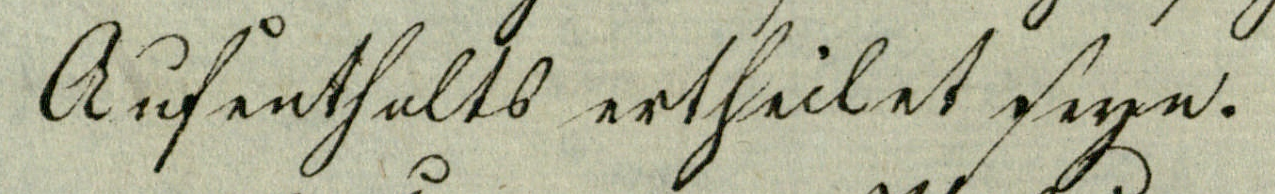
Aufthalts ertheilet seyn.
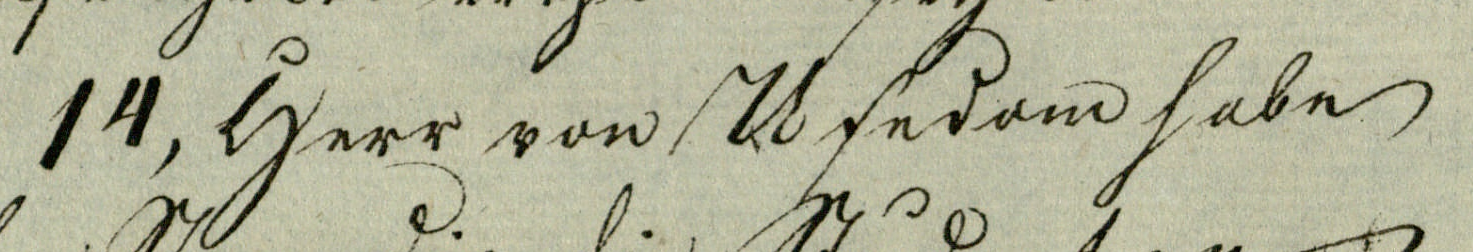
14, Herr von Usedom habe
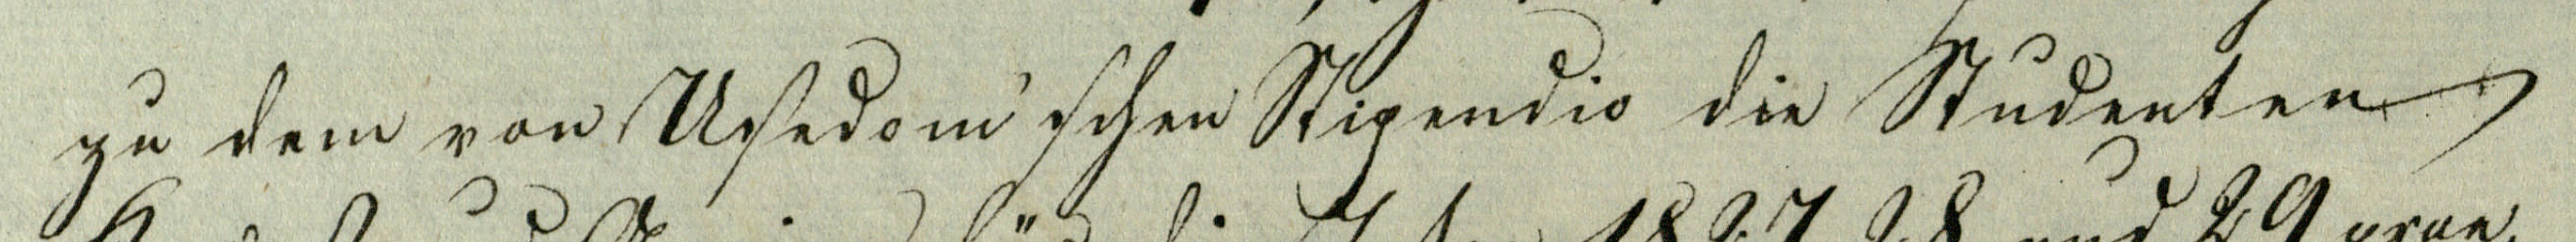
zu dem von Usedom'schen Stipendio die Studenten
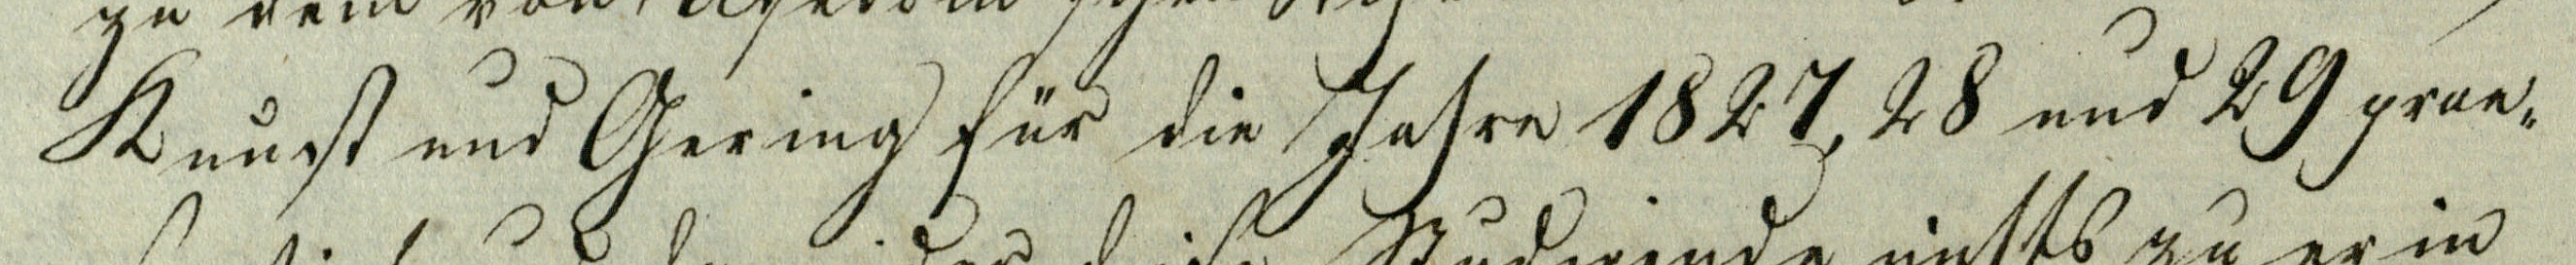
Knust und Gering für die Jahre 1827, 28 und 29 prae¬
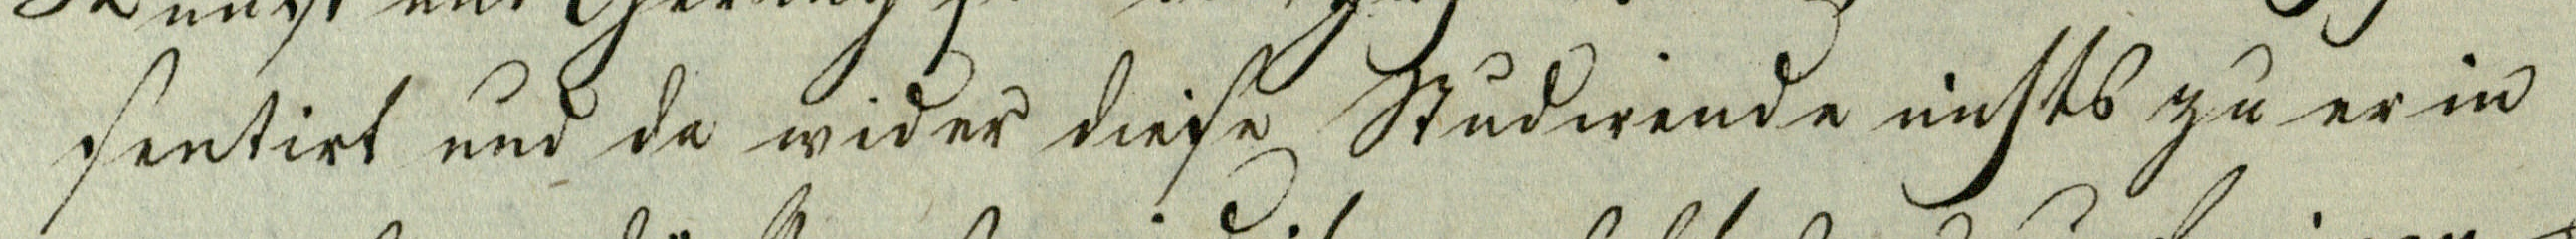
sentiret und da wider diese Studierende nichts zu erin¬
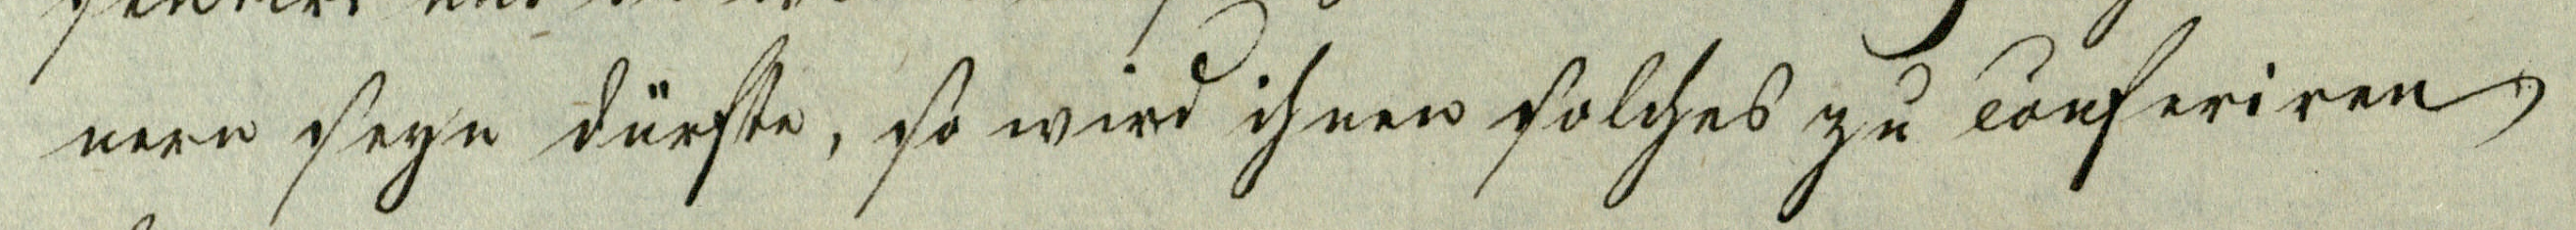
nern seyn dürfte, so wird ihnen solches zu conferiren
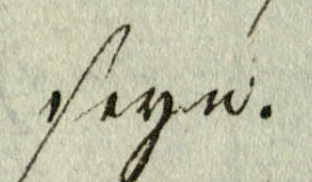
seyn.
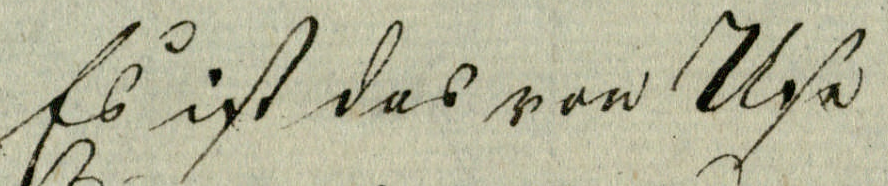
Es ist das von Use¬
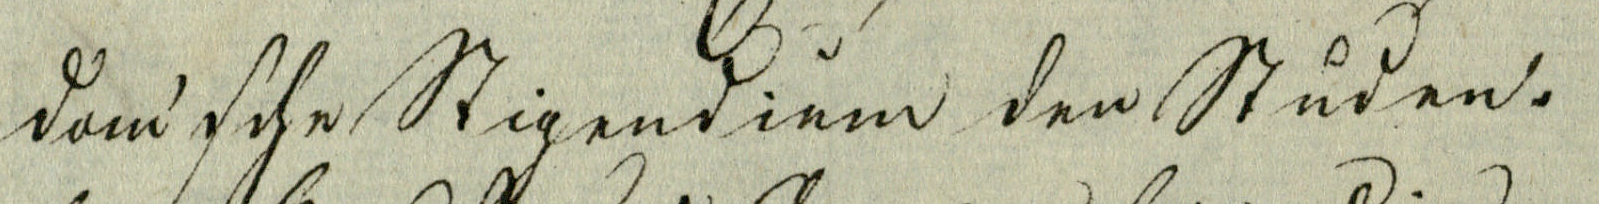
dom'sche Stipendium den Studen¬
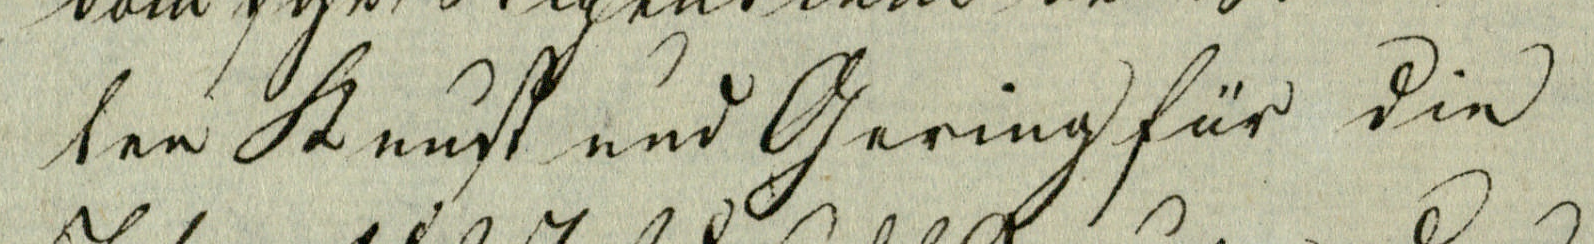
ten Kunst und Gering für die
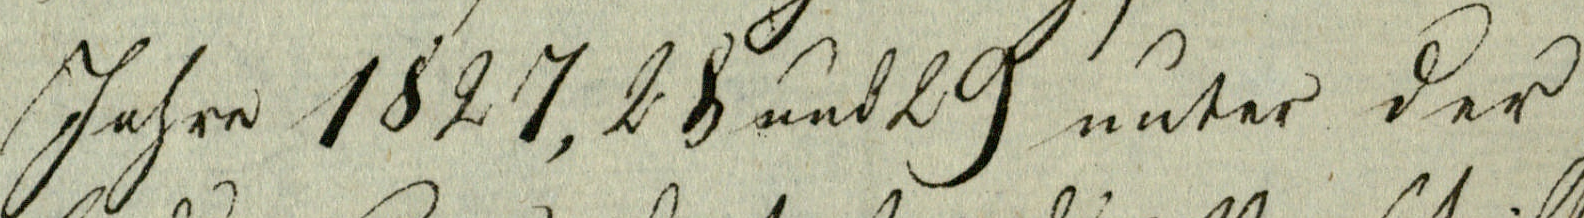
Jahre 1827, 28 und 29 unter der
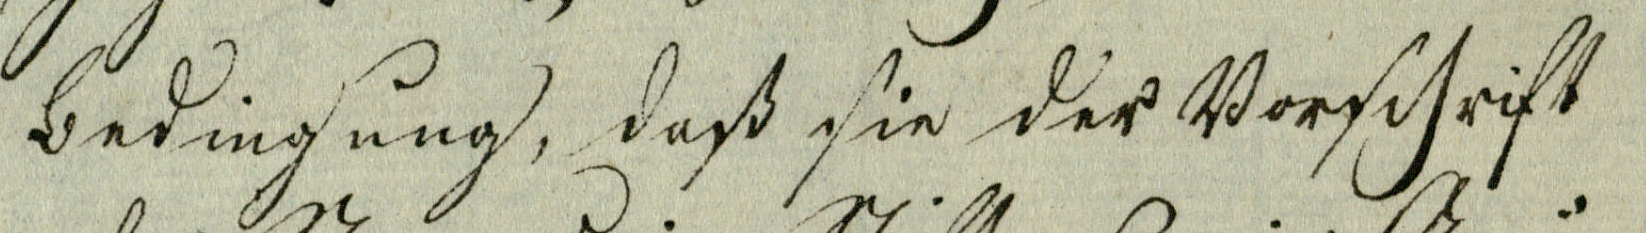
Bedingung, daß sie der Vorschrift
